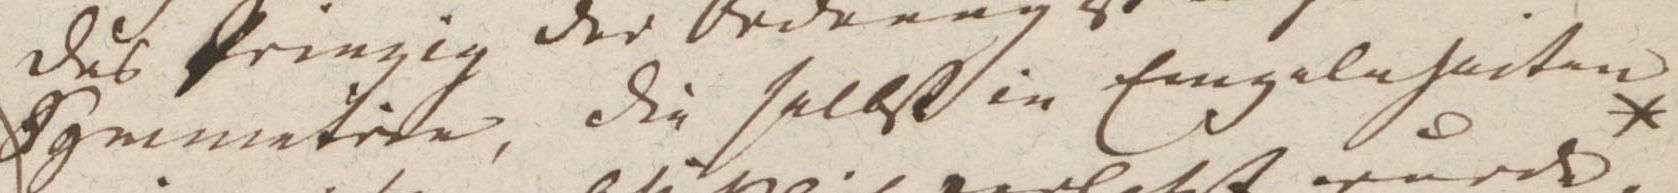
Symmetrie, die selbst in Einzelnheiten
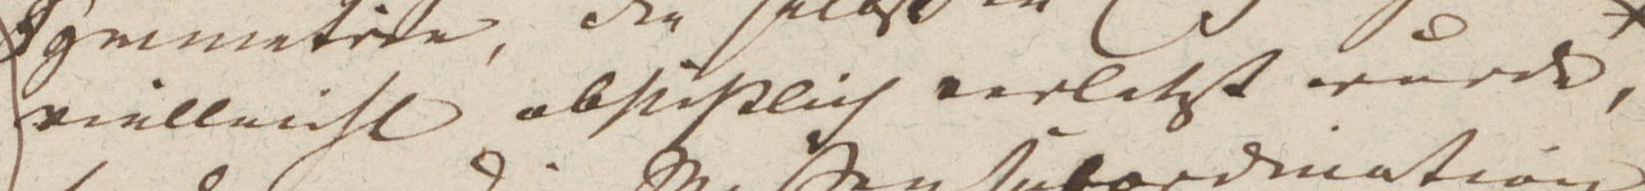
vielleicht absichtlich verletzt wurde, %
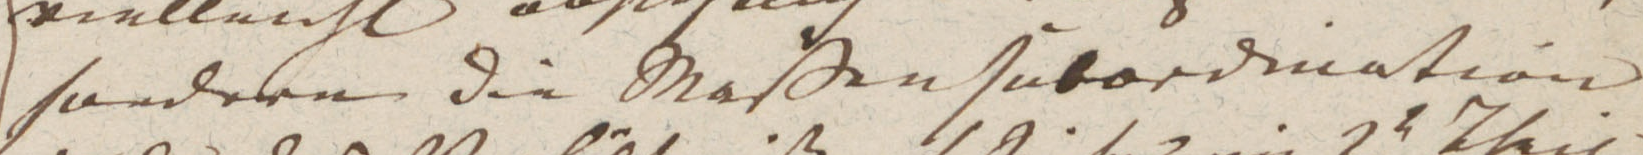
sondern die Massensubordination
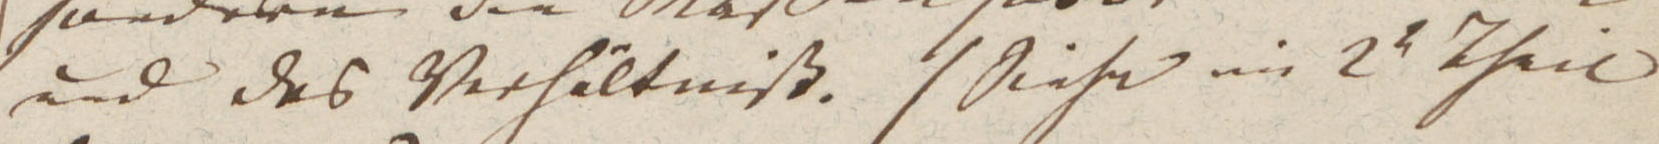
und das Verhältniss. (Siehe im 2 Theil
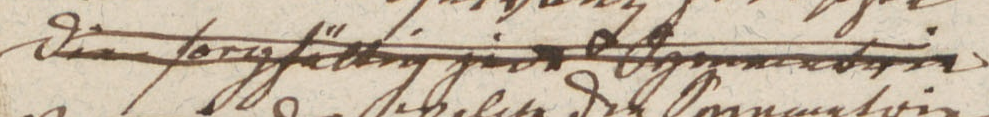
die sorgfältig jede Symmetrie
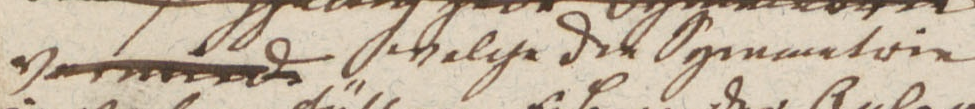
vermied welche die Symmetrie
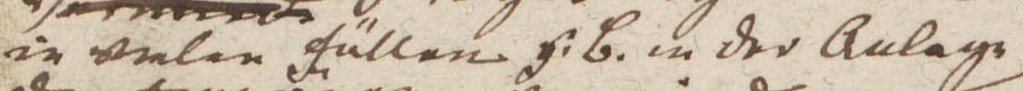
in vielen Fällen z. B. in der Anlage
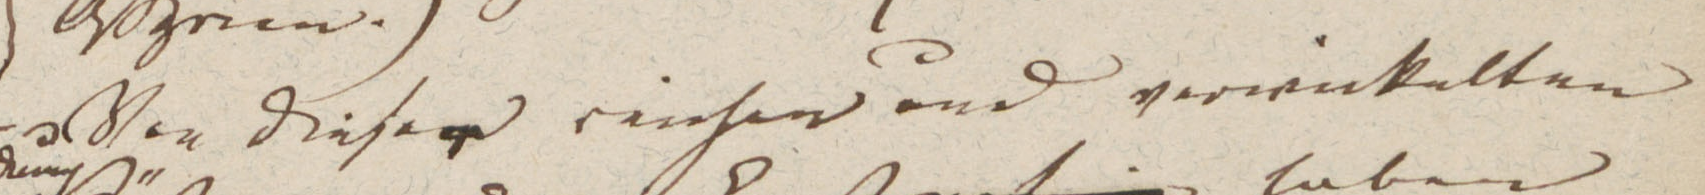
Von dieser reichen und verwinkelten
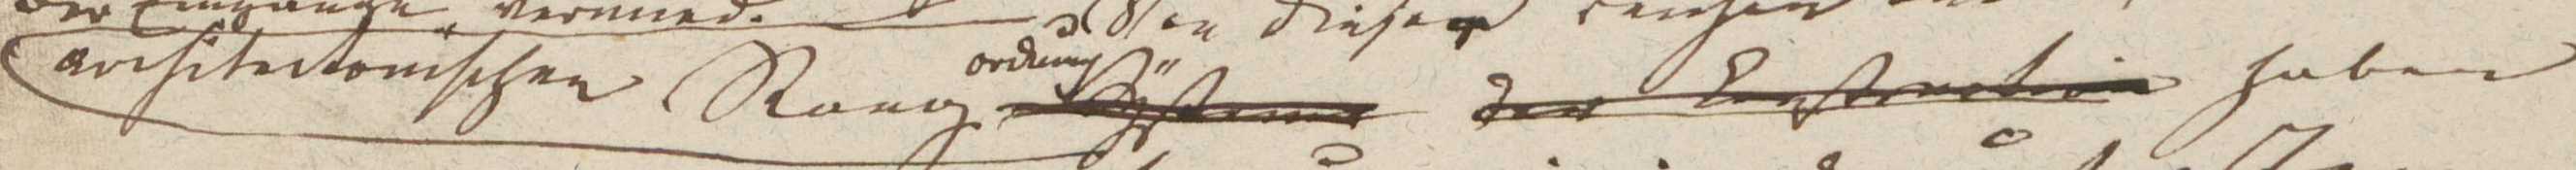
architectonischen Rangordnung System der Construction haben
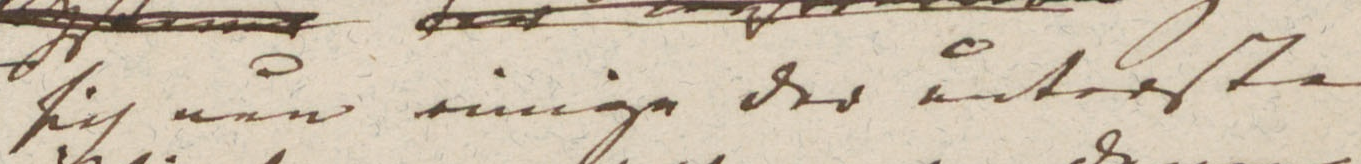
sich nu einige der untersten
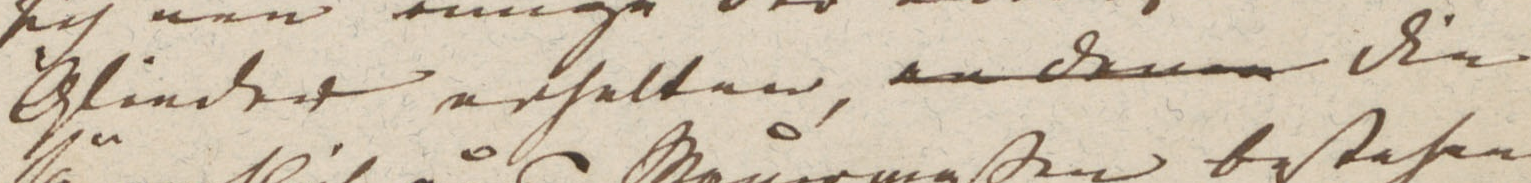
Glieder erhalten, an denen die
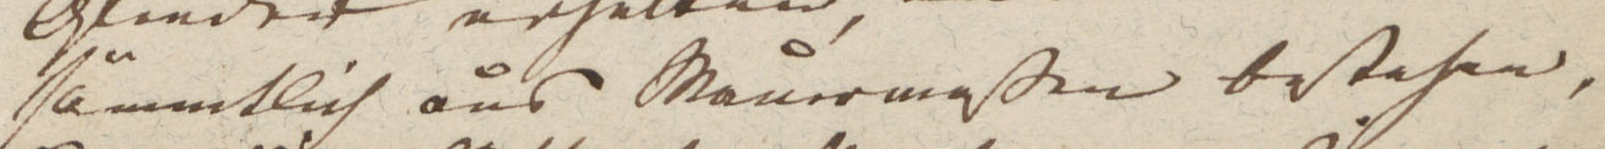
sämmtlich aus Mauermassen bestehen,
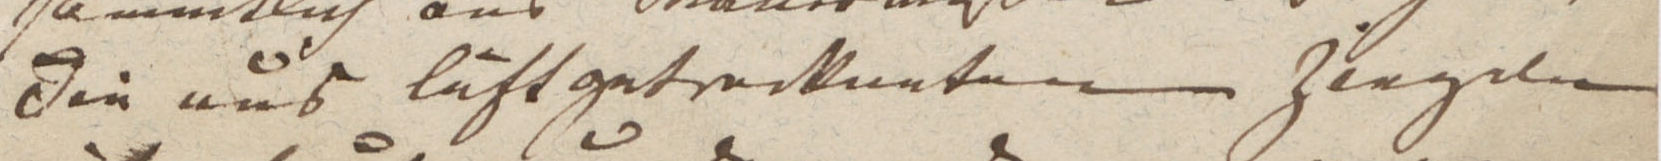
die aus luftgetrockneten Ziegeln
